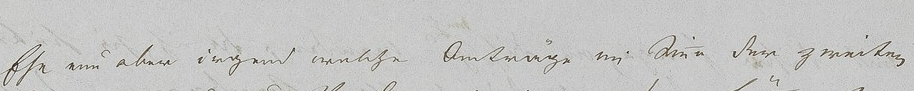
Ehe nun aber irgend welche Anträge im Sinne der zweiten
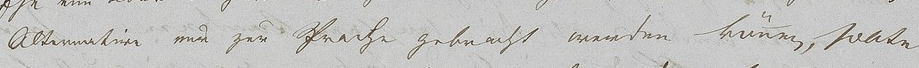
Alternative nur zur Sprache gebracht werden können, sollte
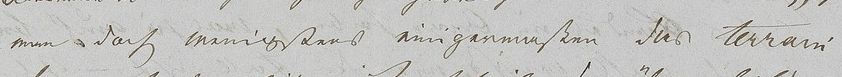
man doch wenigstens einigermaßen das terrain
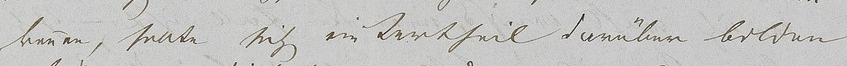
kennen, sollte sich ein Urtheil darüber bilden
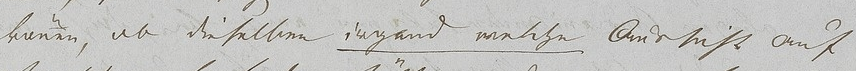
können, ob diselben irgend welche Aussicht auf
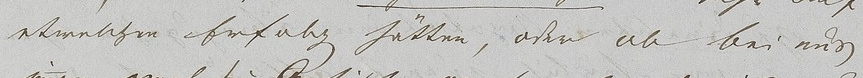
etwelchen Erfolg hätten, oder ob bei uns
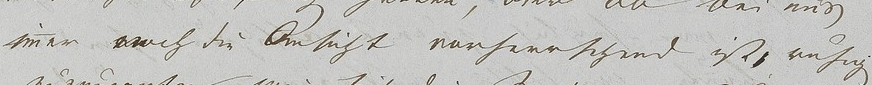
immer noch die Ansicht vorherrschend ist, ruhig
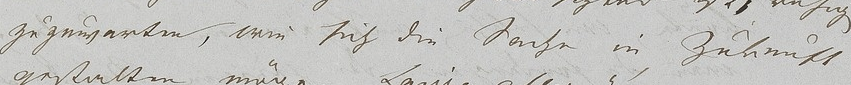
zuzuwarten, wie sich die Sache in Zukunft
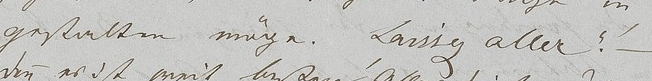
gestalten möge. «Laissez aller»! – –
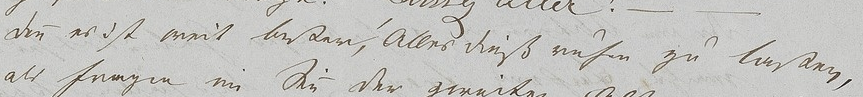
Denn es ist weit beßer, Alles dieß ruhen zu laßen,
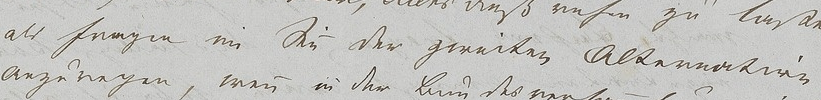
als Fragen im Sinn der zweiten Alternative
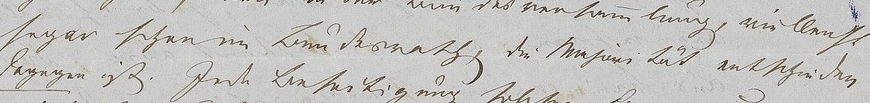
sogar schon im Bundesrath, die Majorität entschieden
